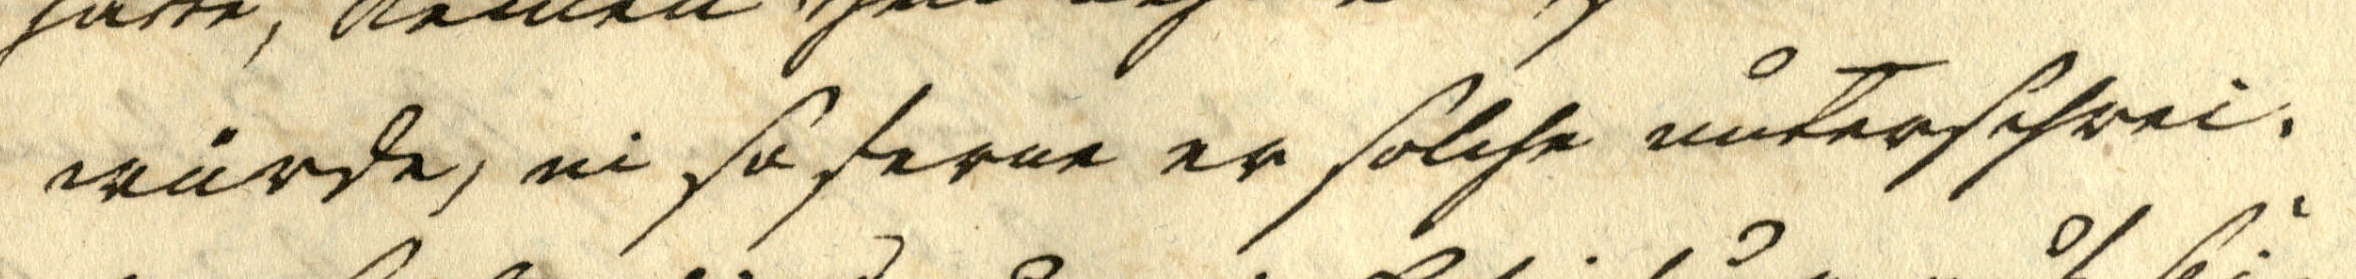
würde, in so ferne er solche unterschrei¬
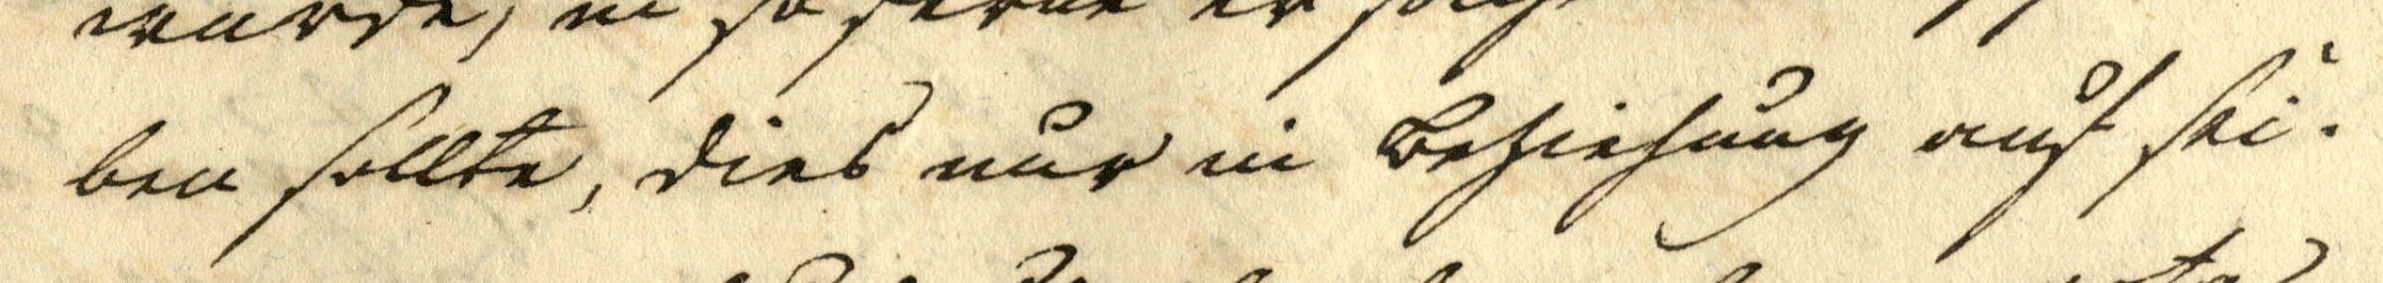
ben sollte, dies nur in Beziehung auf sei¬
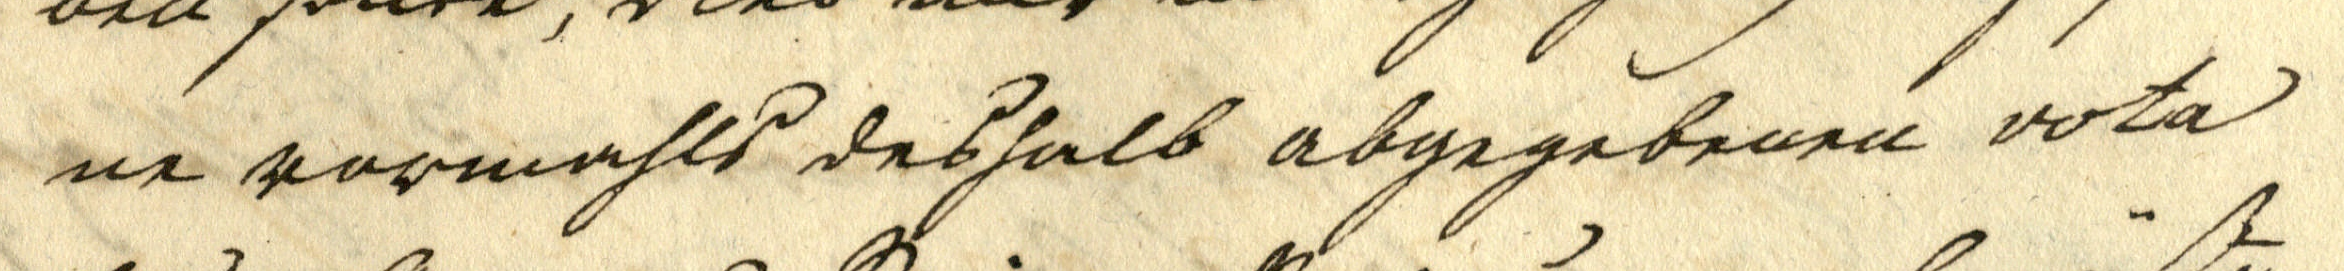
ne vormahls deshalb abgegebenen vota
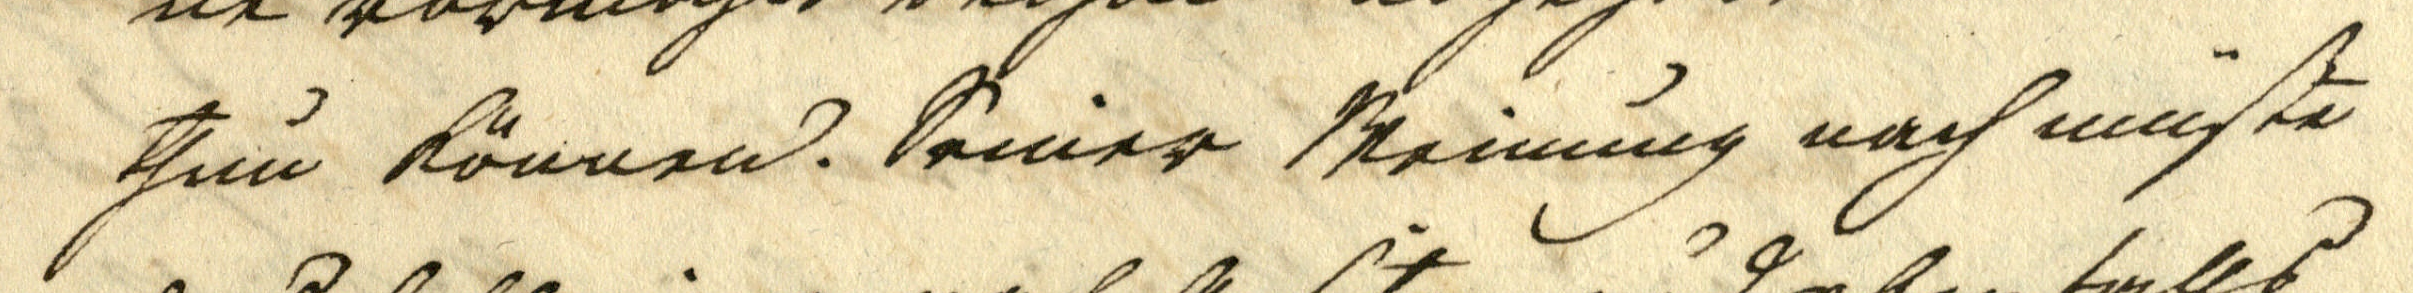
thun können. Seiner Meinung nach müßte
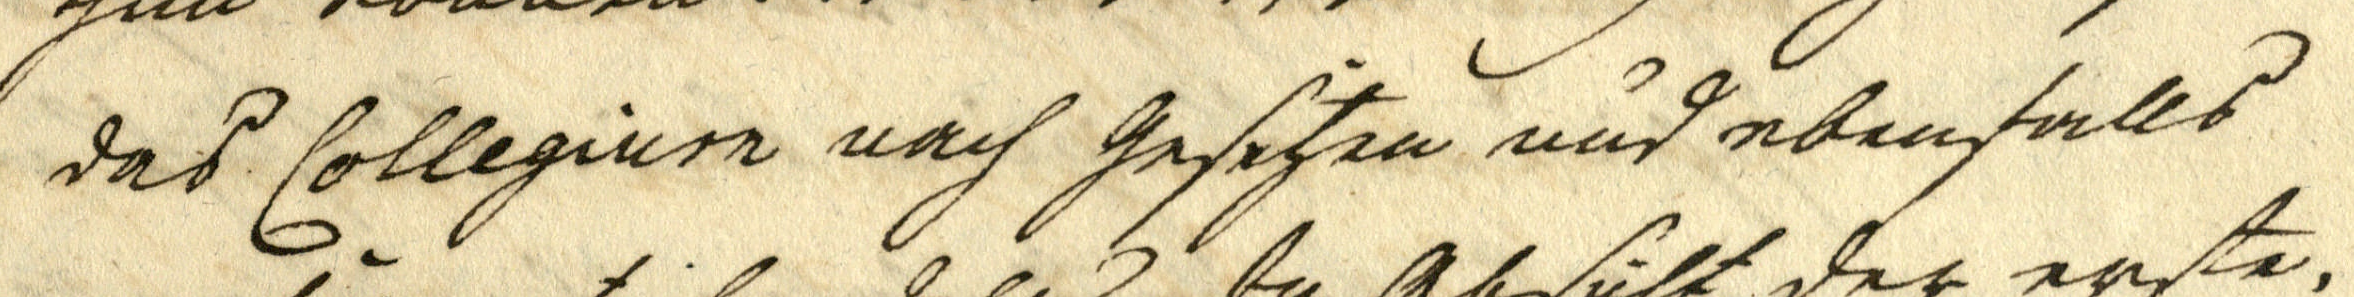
das Collegium nach Gesetzen und ebenfalls
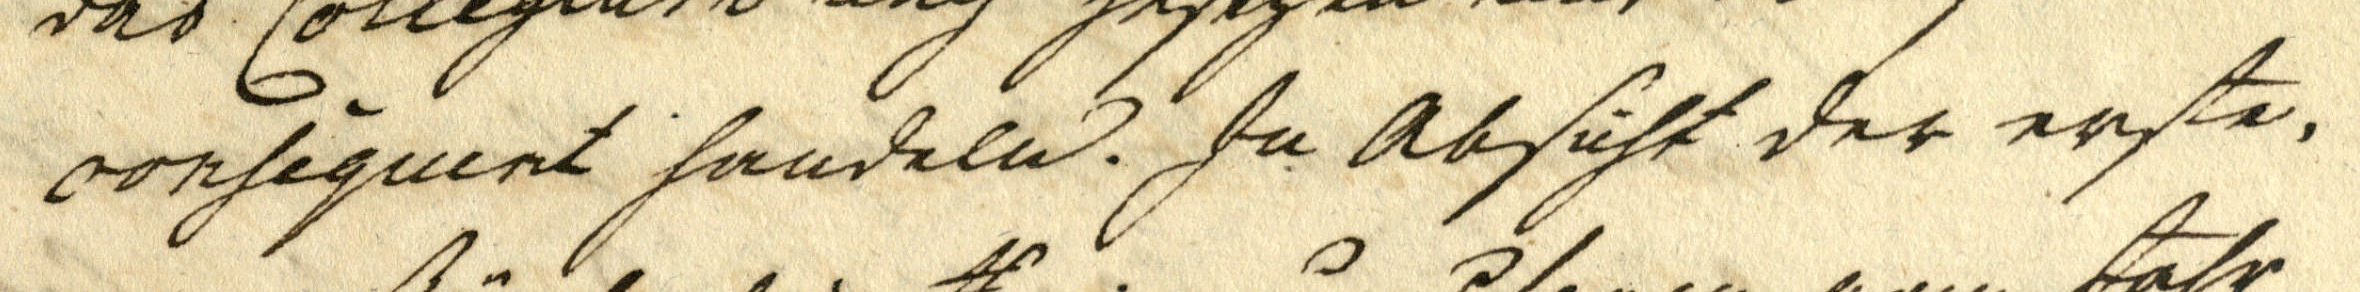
consequent handeln. In Absicht der erste¬
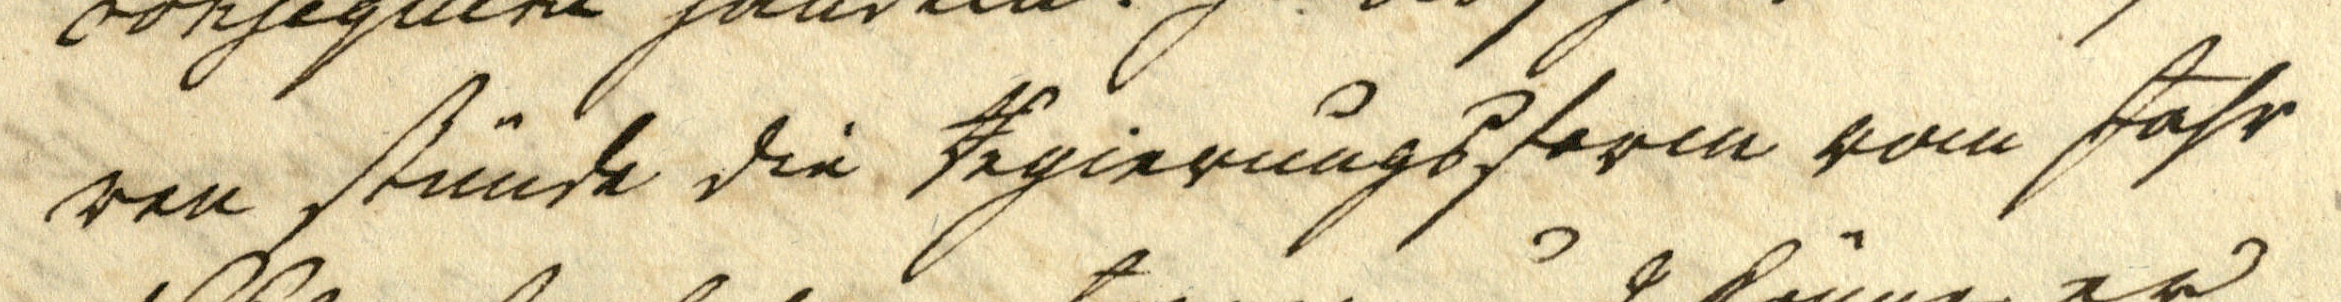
ren stünde die Regierungsform vom Jahr
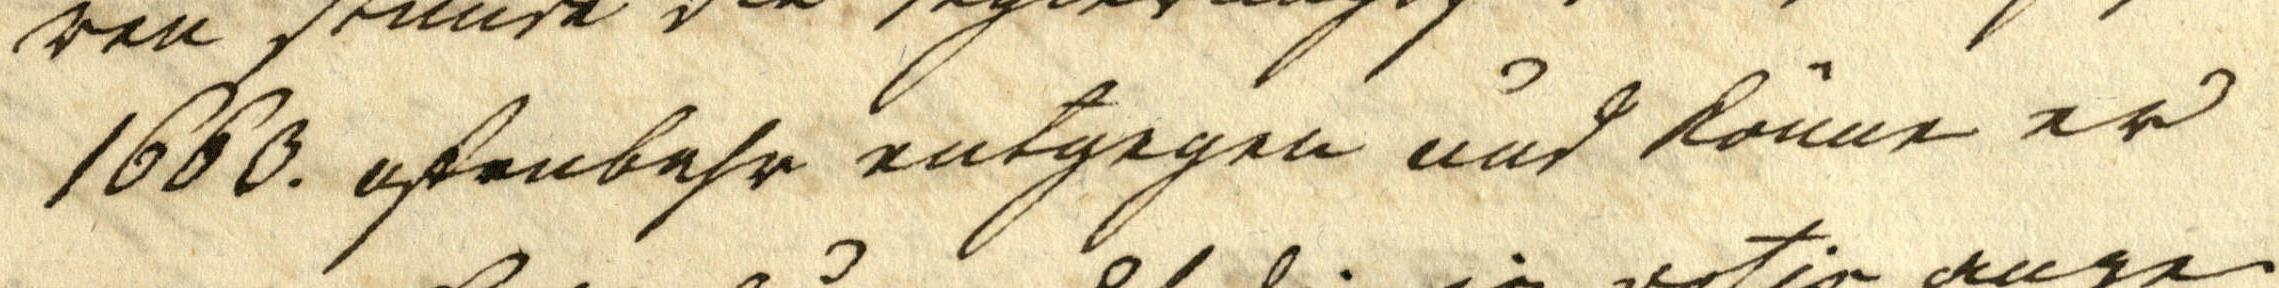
1663. ofanbehr entgegen und könne er
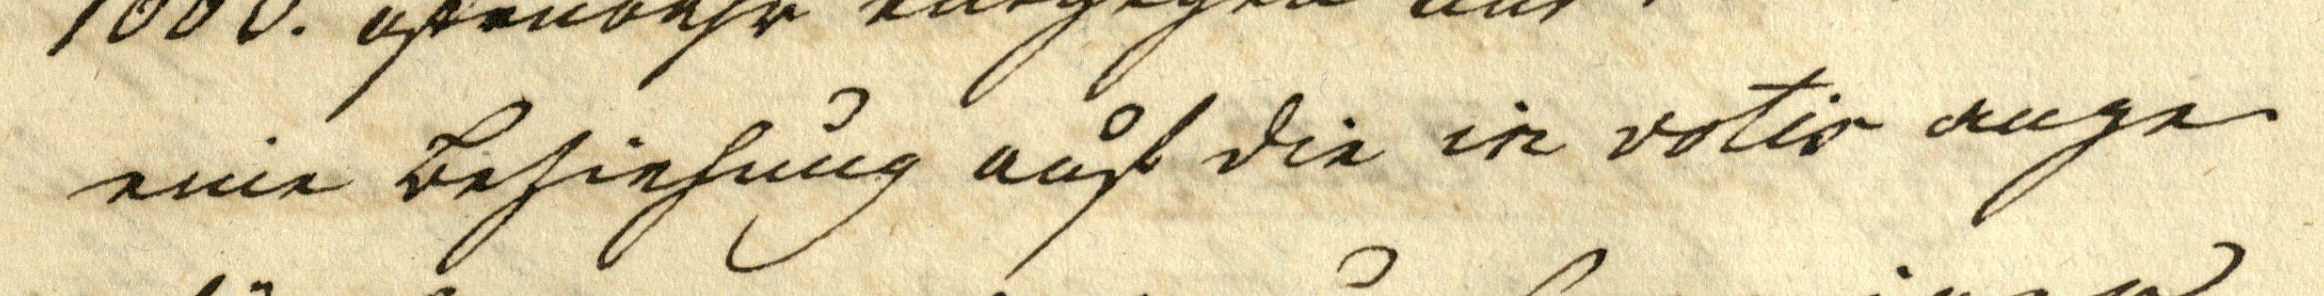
eine Beziehung auf die in votis ange¬
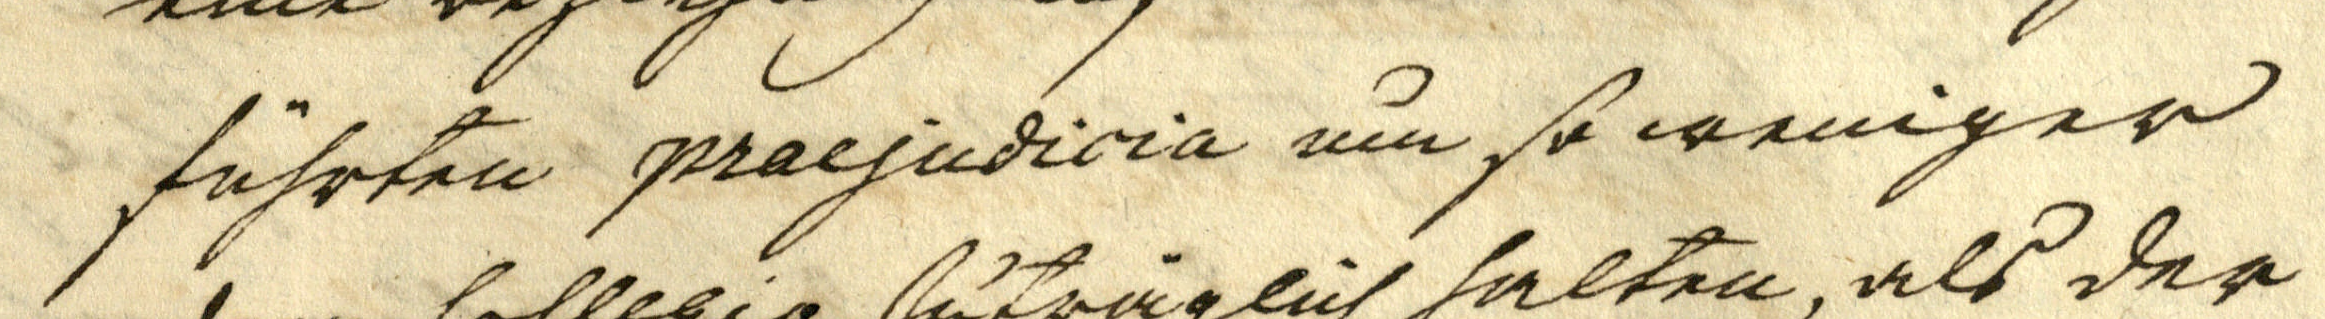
führten praejudicia um so weniger
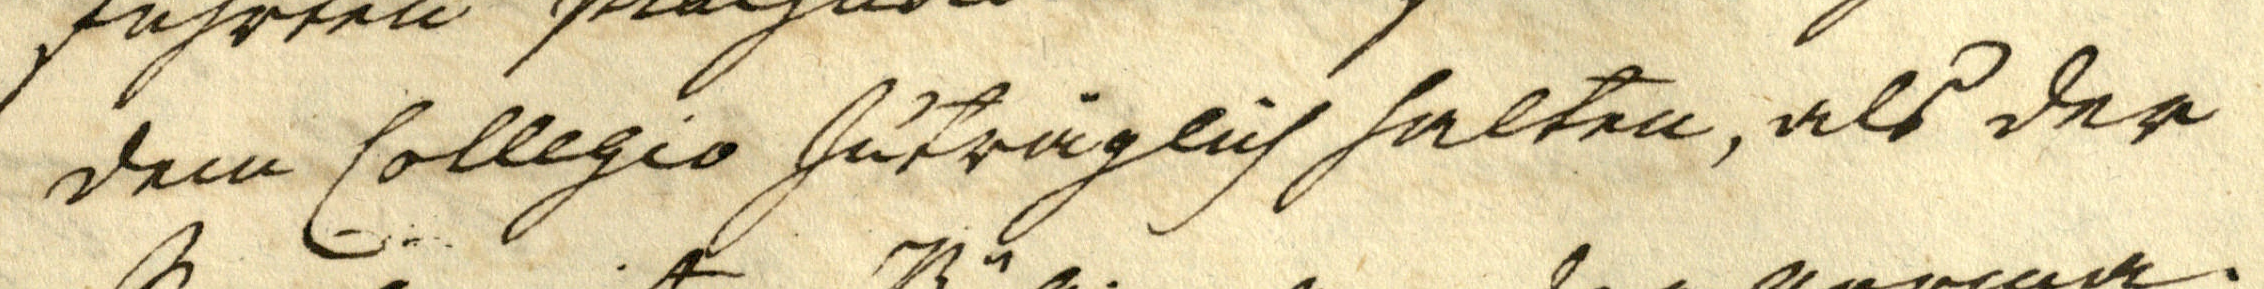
dem Collegio zuträglich halten, als der
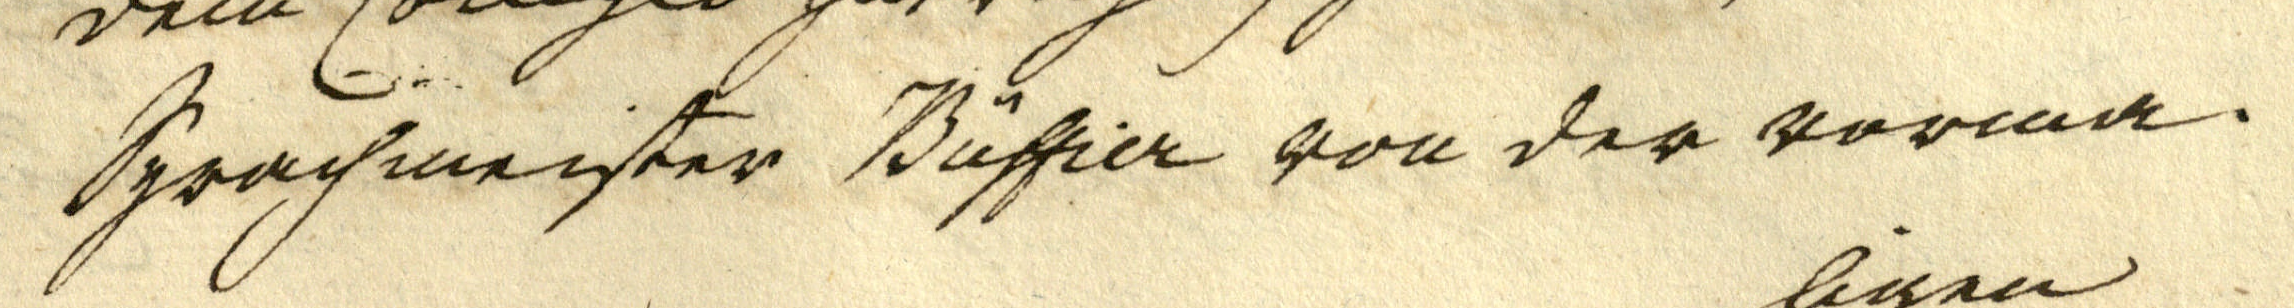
Sprachmeister Büffier von der vorma¬
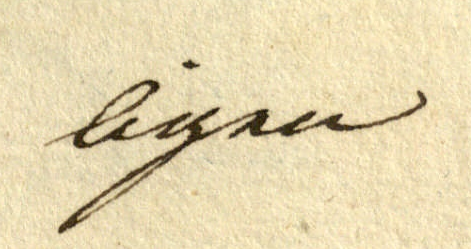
ligen
